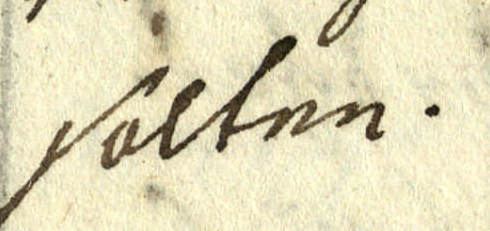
solten.
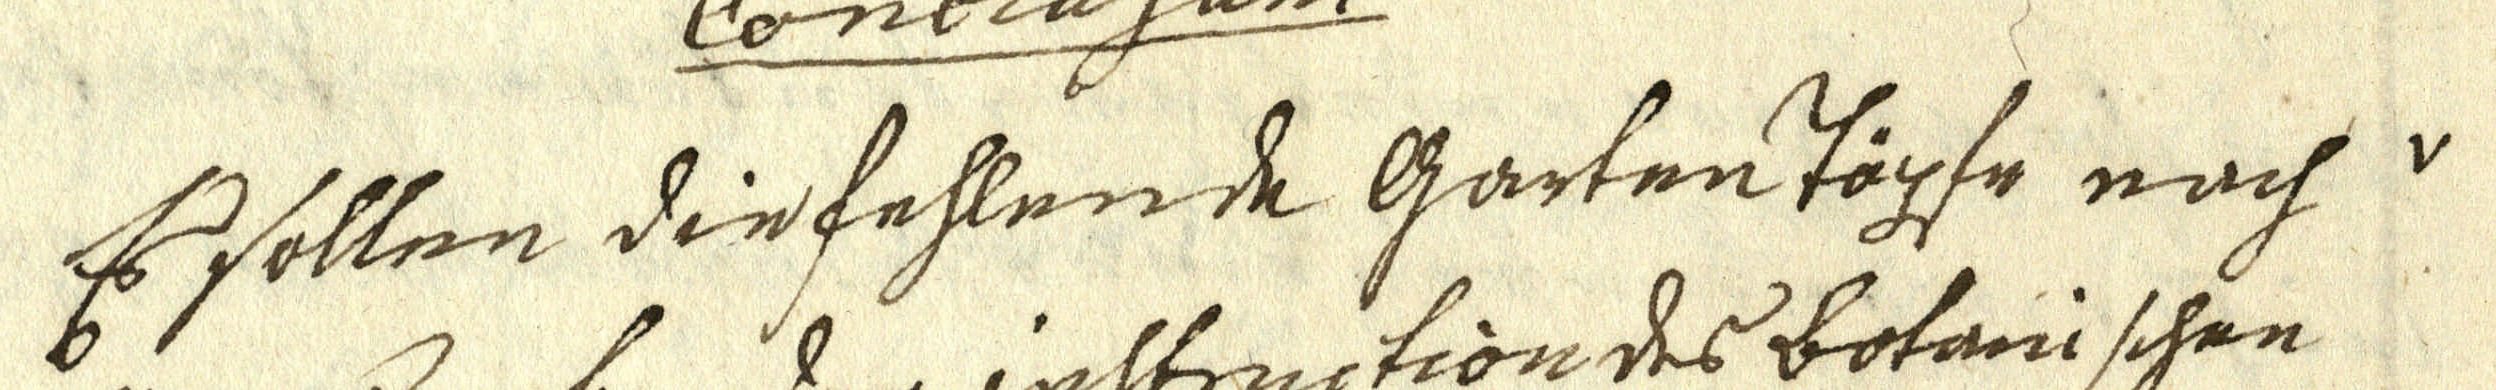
Es sollen die fehlende GartenTöpfe nach
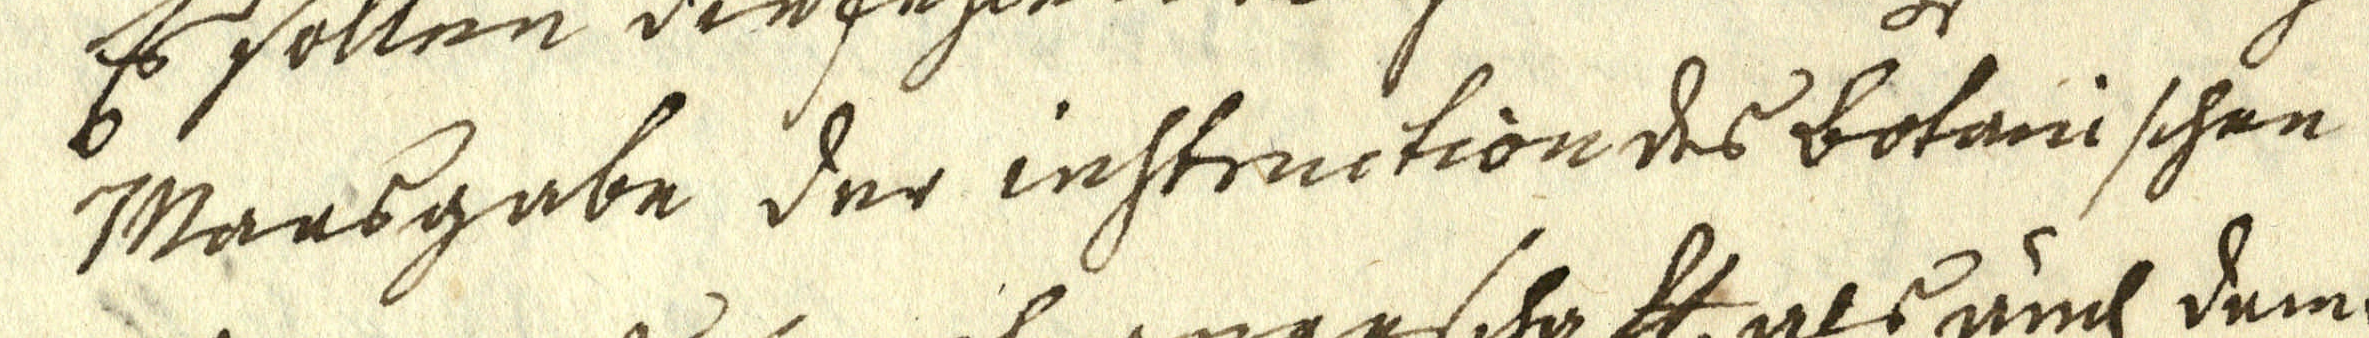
Maasgabe der instruction des Botanischen
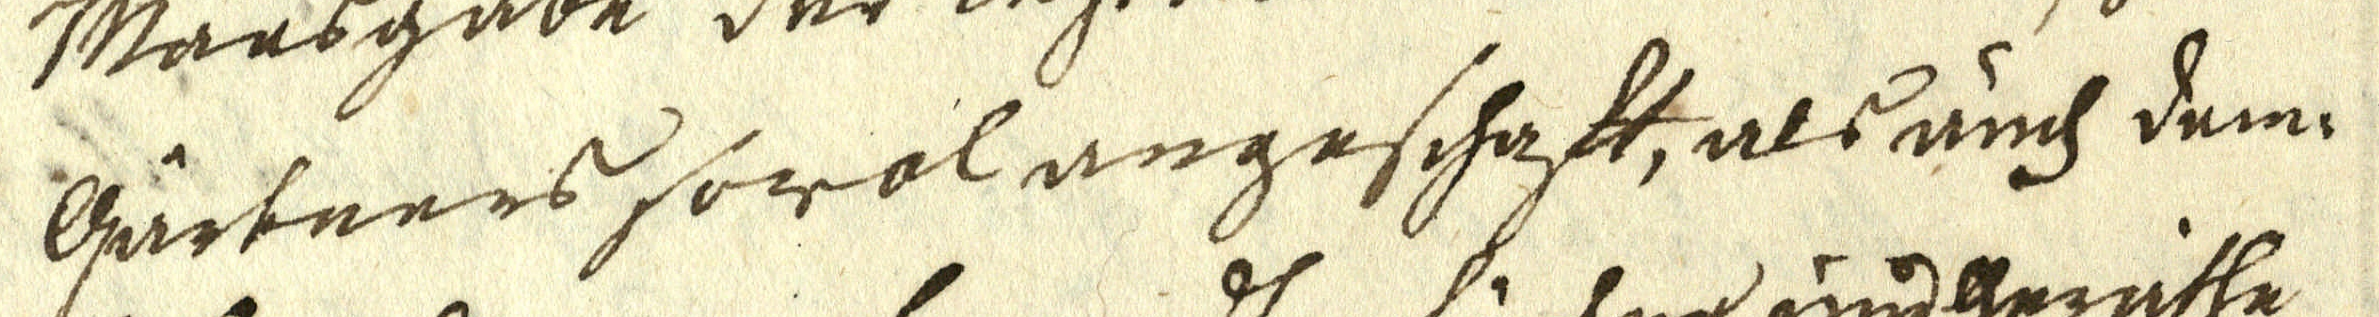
Gärtners sowol angeschaft, als auch dem¬
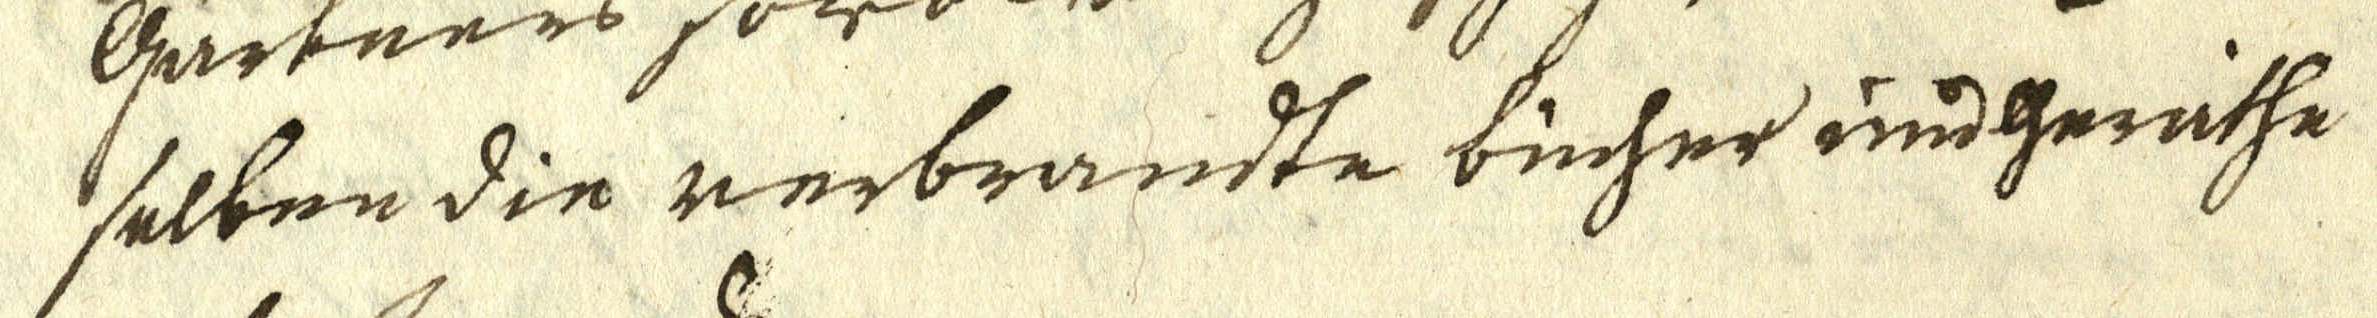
selben die verbrandte Bücher in Geräthe
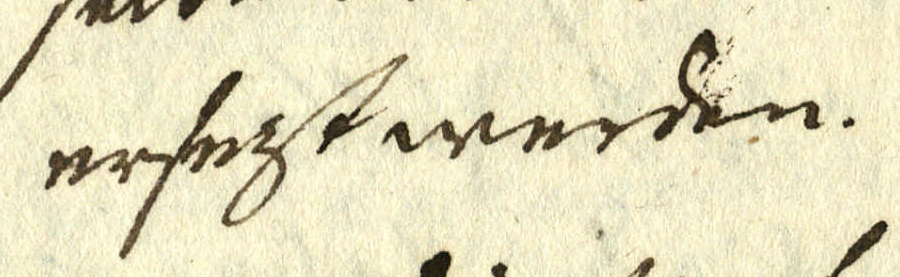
ersezt werden.
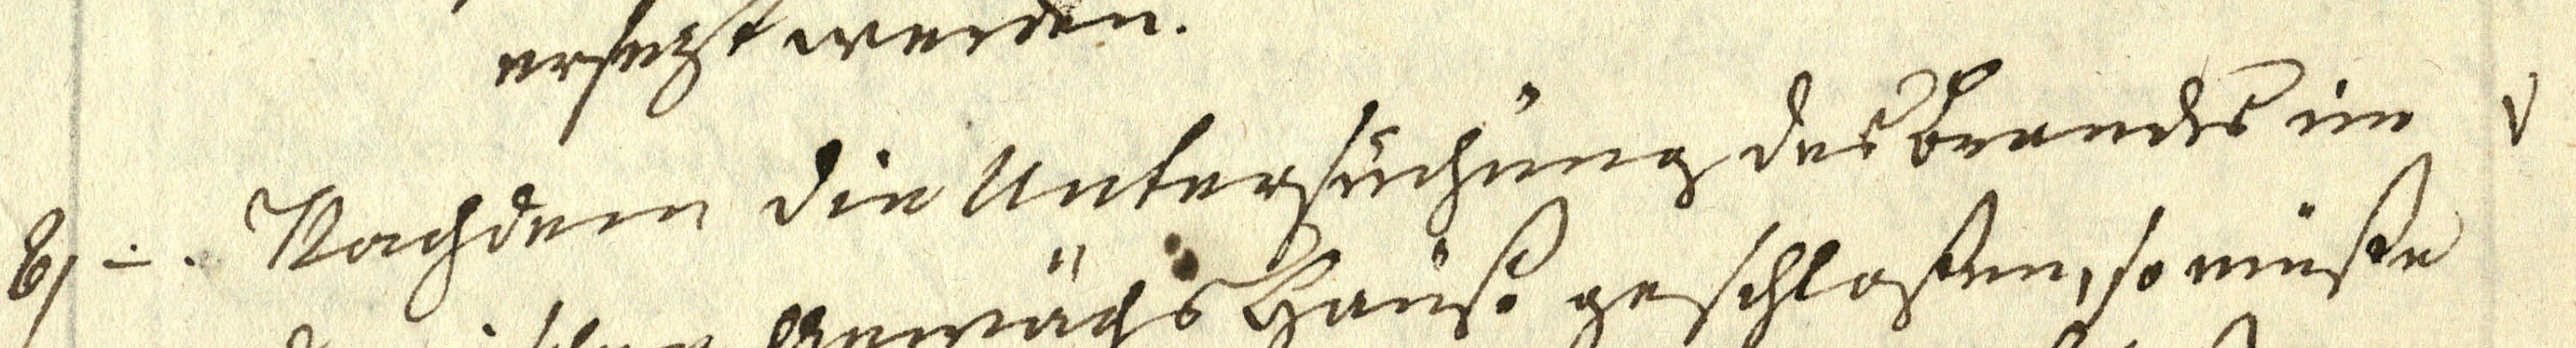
8, Nachdem die Untersuchung des Brandes im
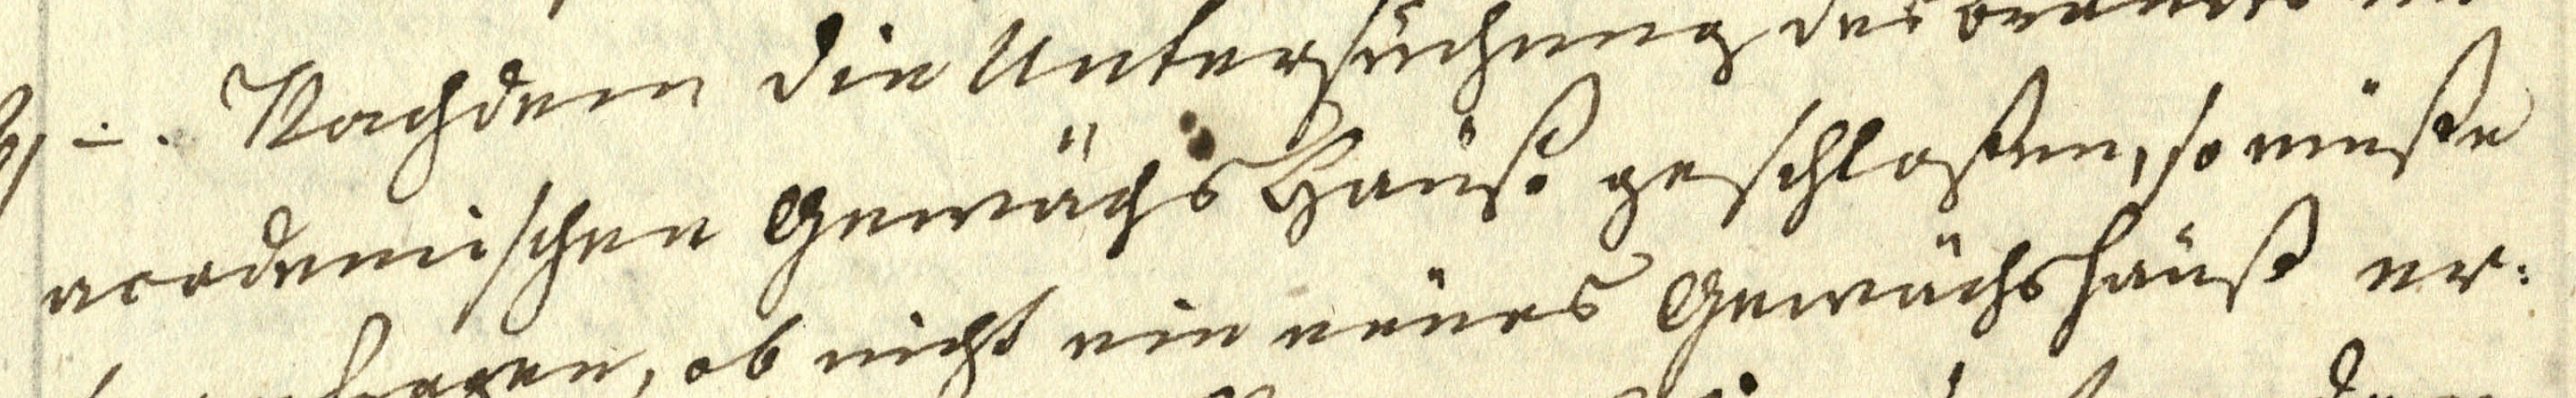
academischen Gewächs Hause geschloßen, so müße
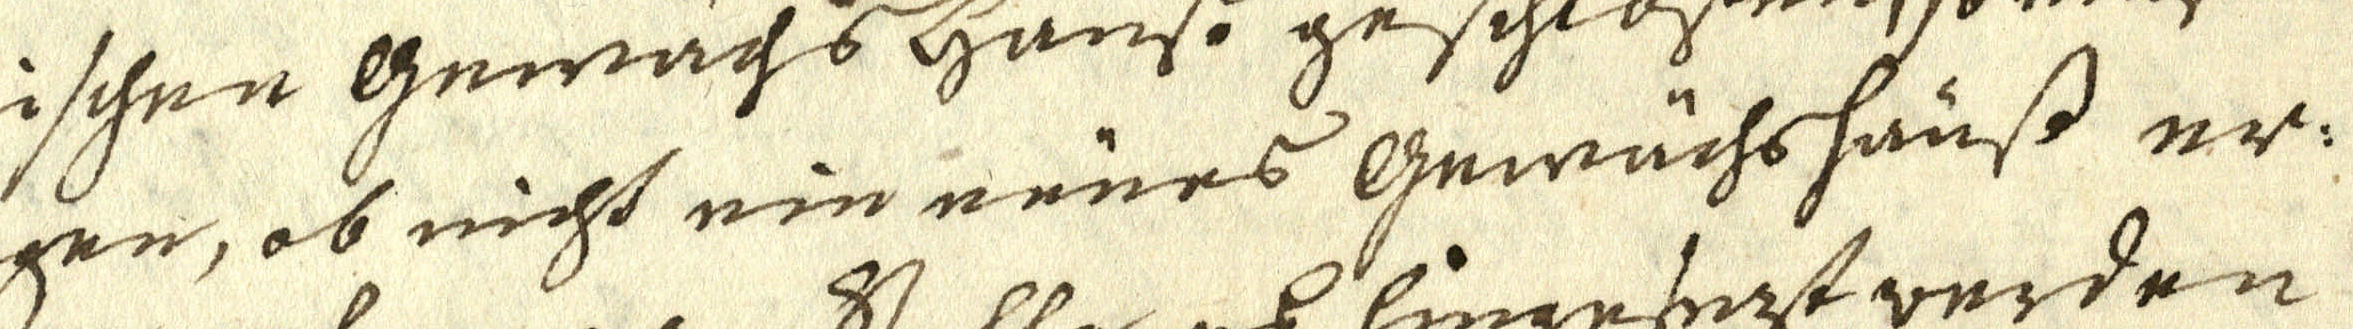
Er anfragen, ob nicht ein neues Gewächshauß er¬
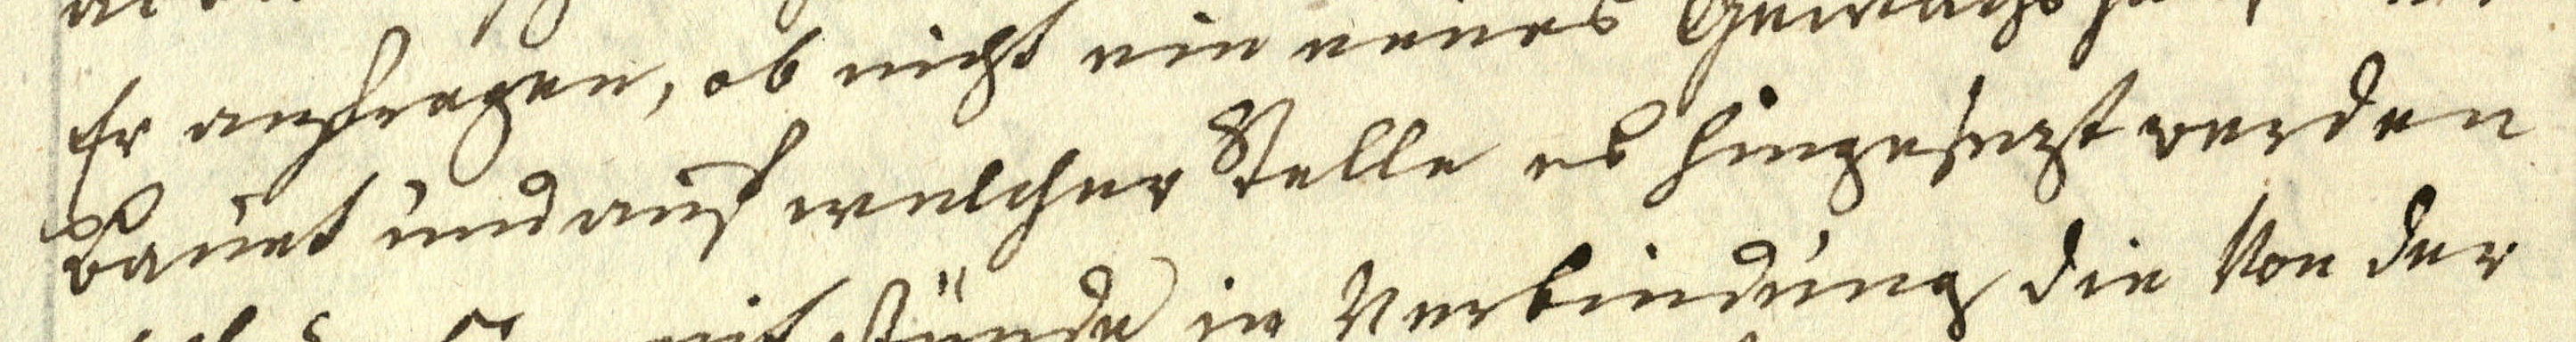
bauet und auf welcher Stelle es hingesezt werden
